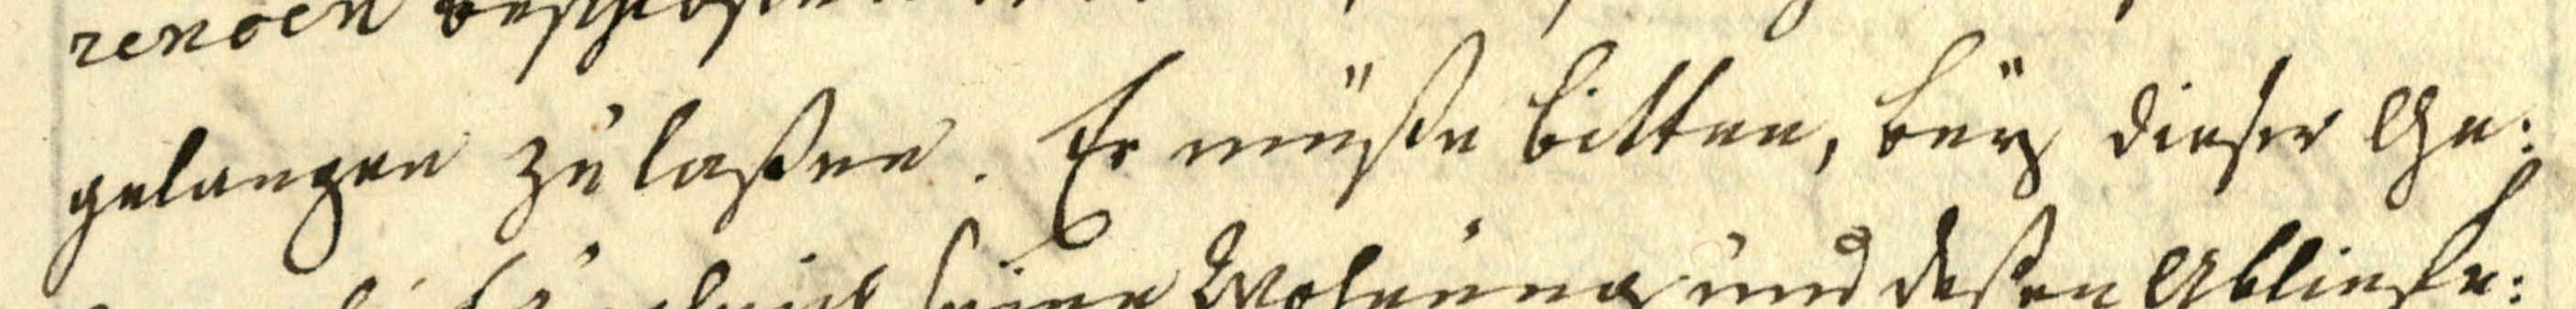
gelangen zu laßen. Er müße bitten, beÿ dieser Ge¬
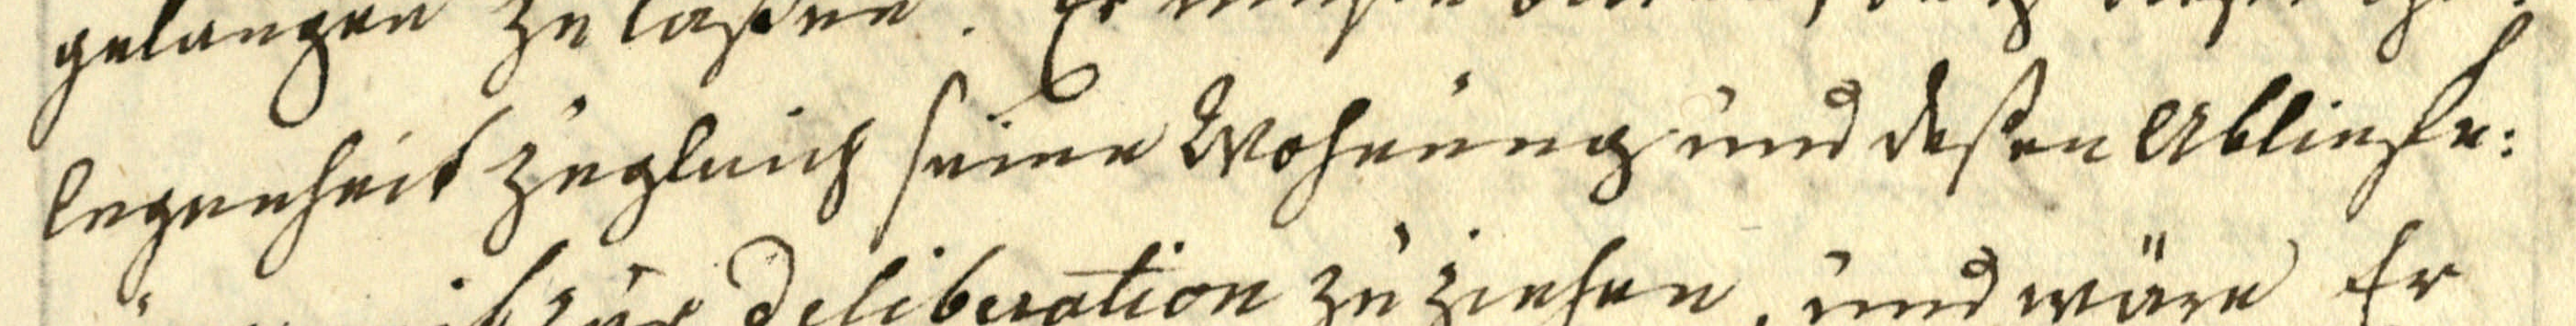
legenheit zugleich seine Wohnung und deßen Abliefe¬
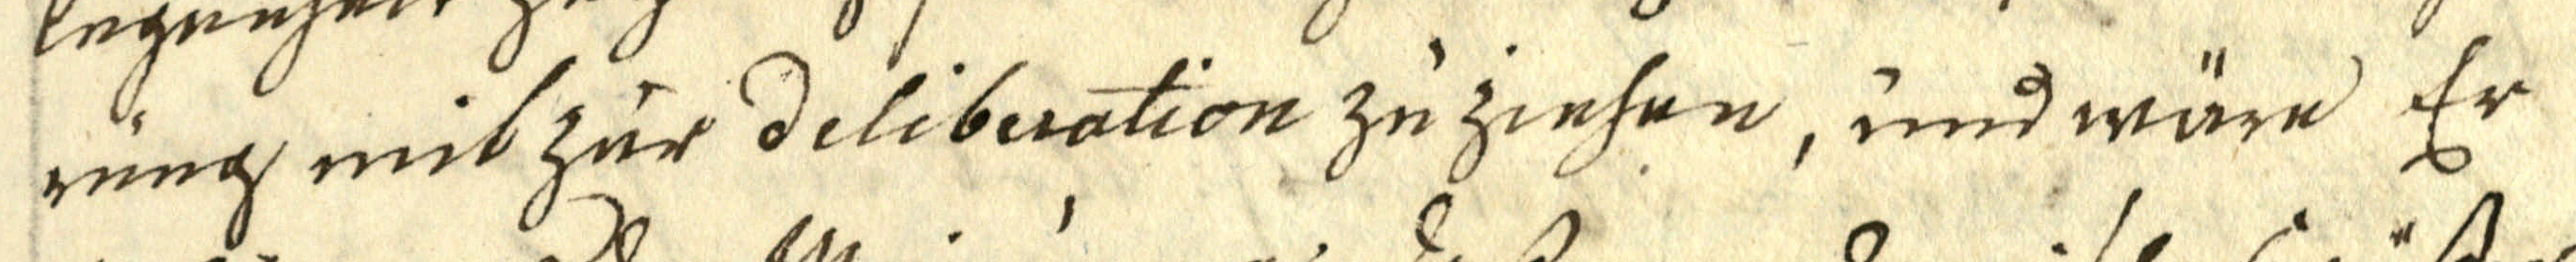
rung mit zur deliberation zu ziehen, und wäre Er
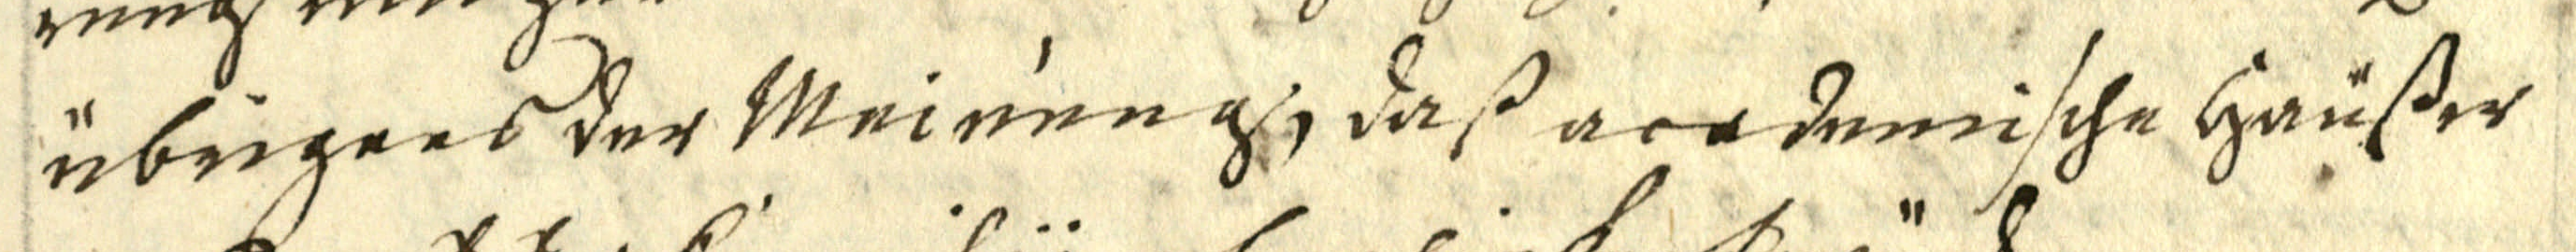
übrigens der Meinung, daß academische Häußer
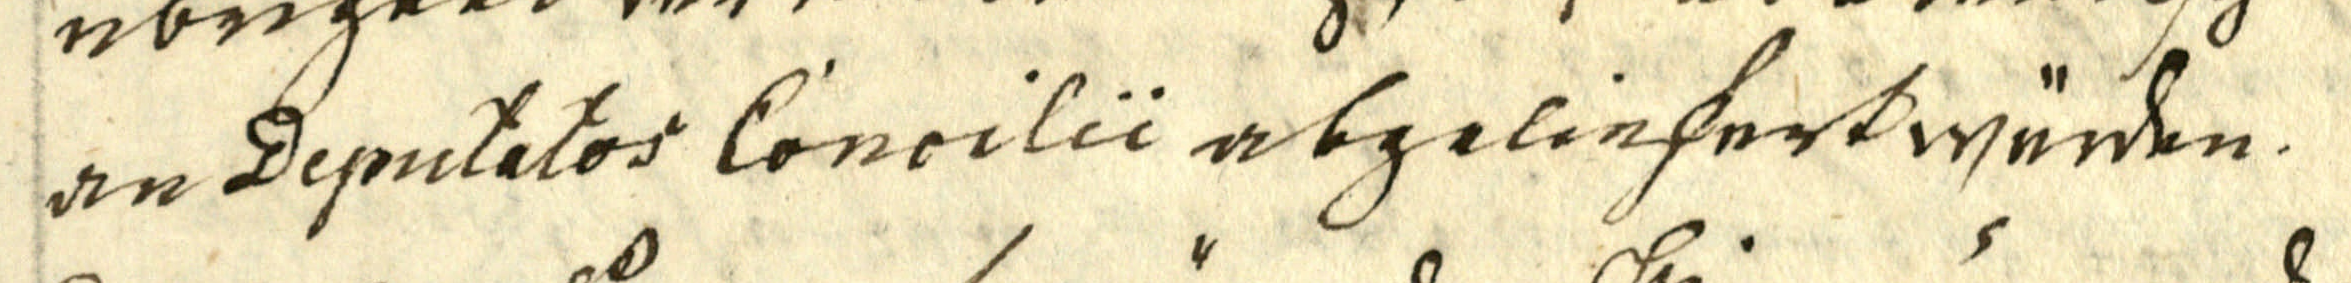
an Deputatos Concilii abgeliefert würden.
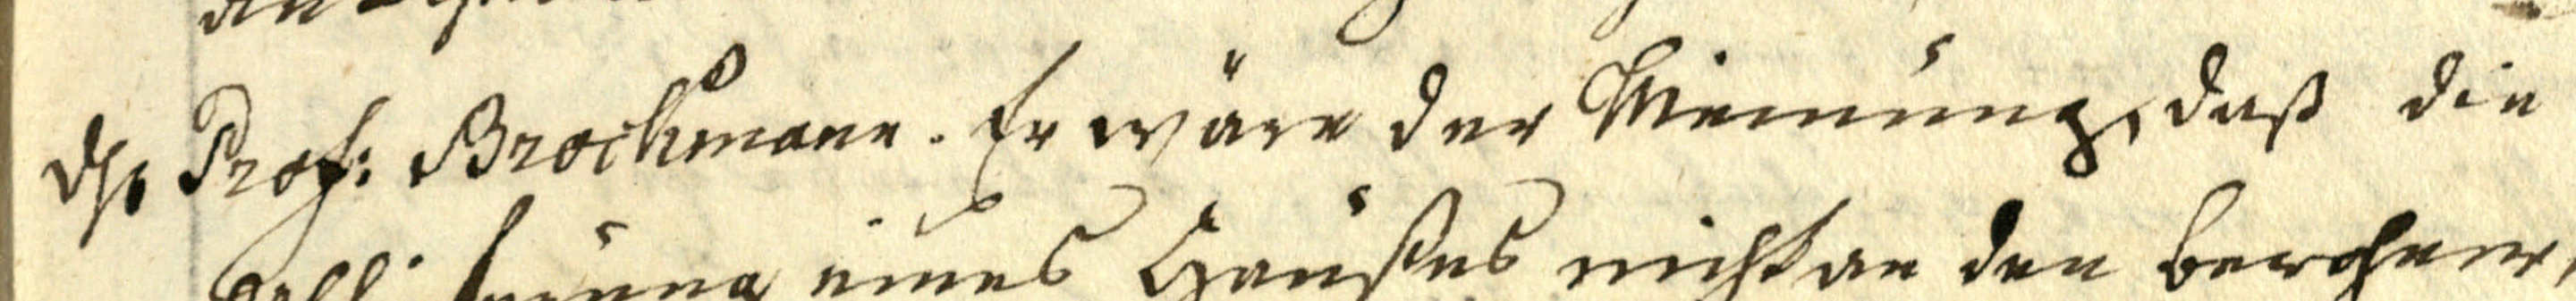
dh. Prof. Brockmann. Er wäre der Meinung, daß die
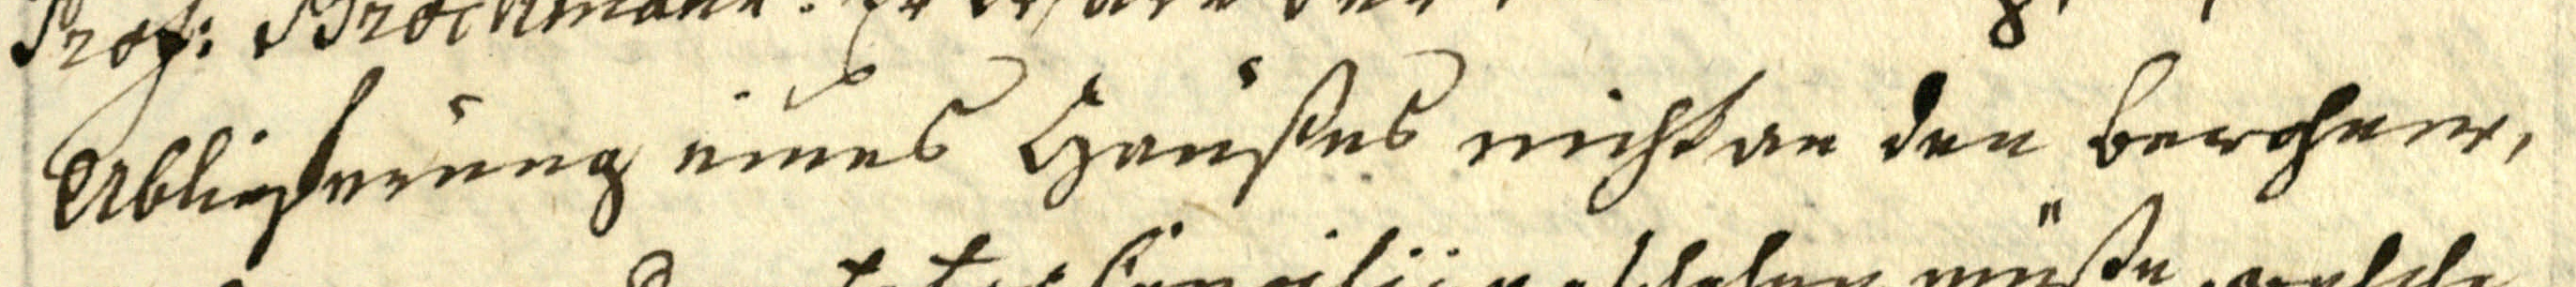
Ablieferung eines Haußes nicht an den Bewohner,
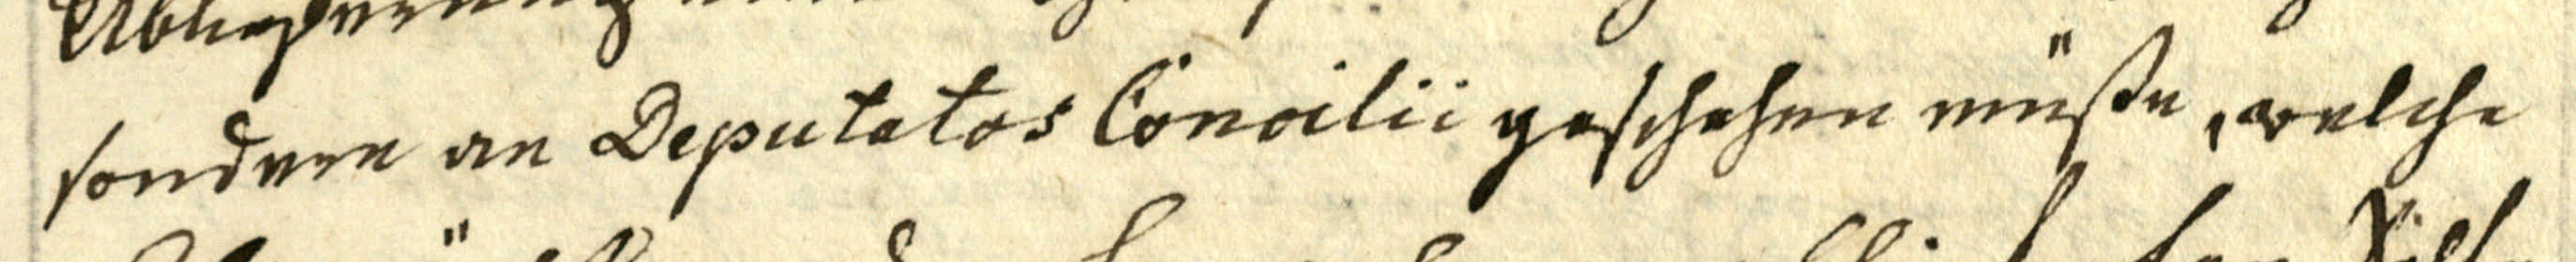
sondern an Deputatos Concilii geschehen müße, welche
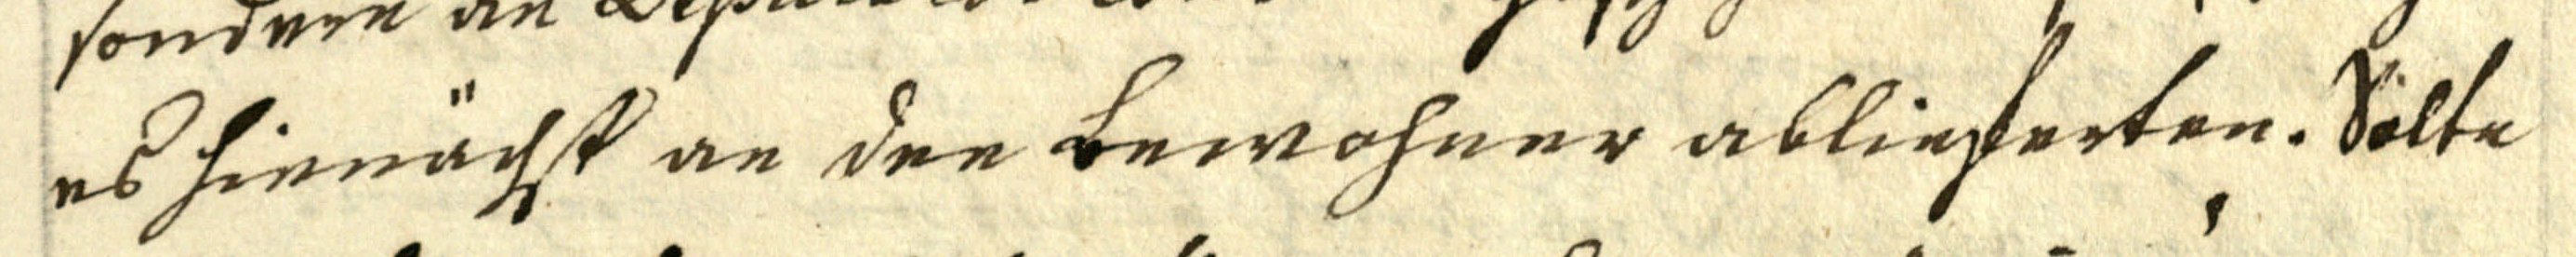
es hienächst an den Bewohner ablieferten. Solte
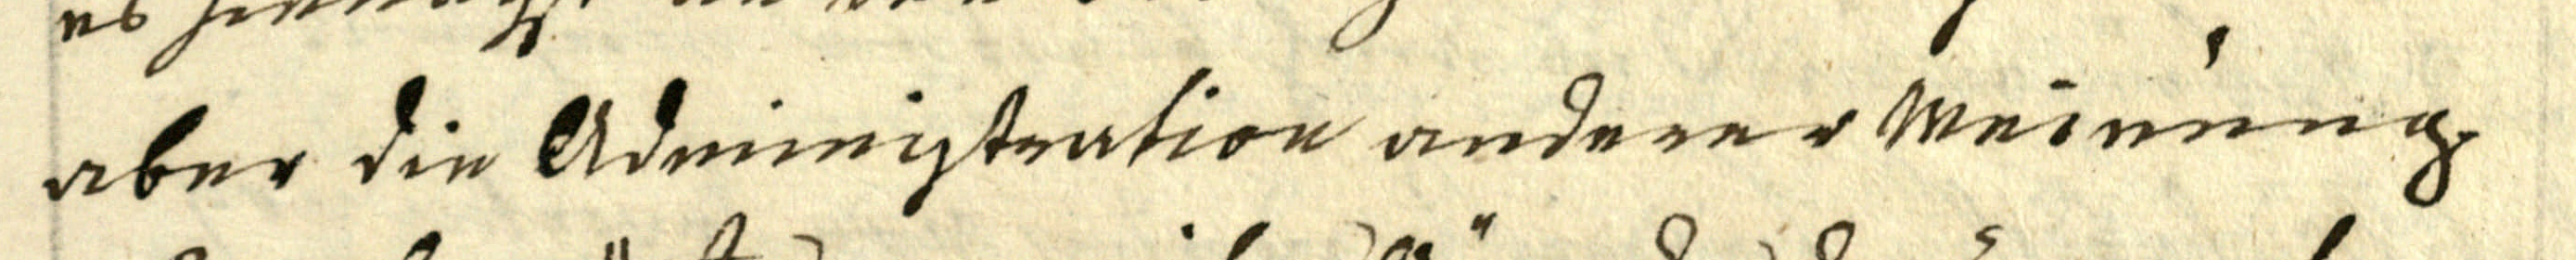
aber die Administration anderer Meinung
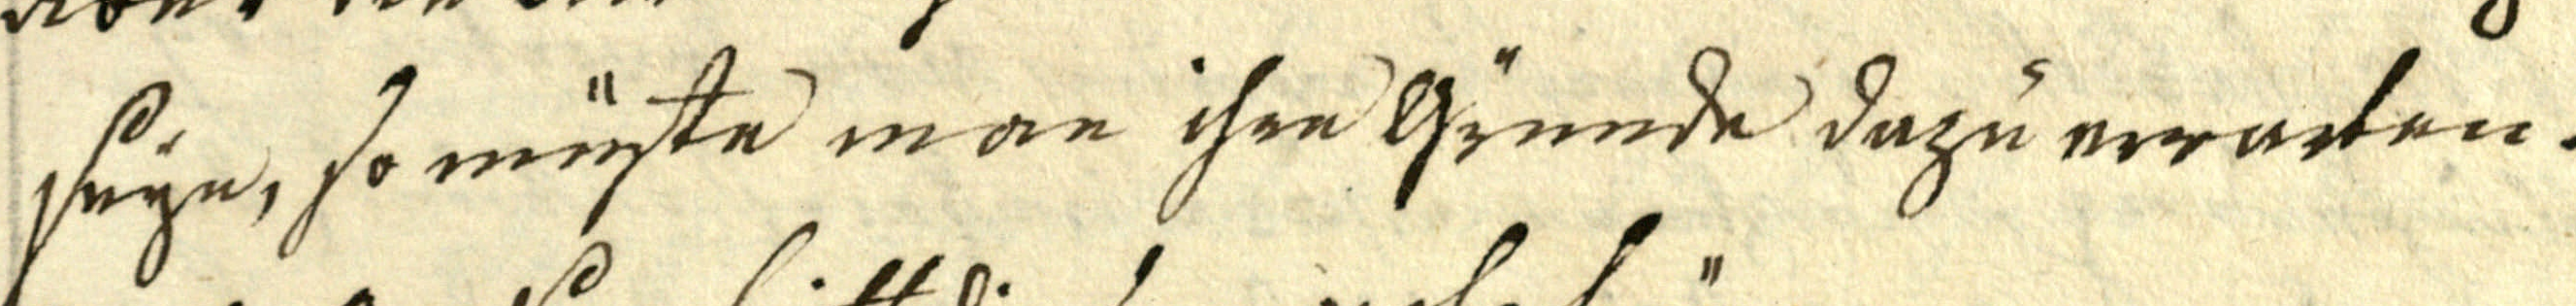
seÿn, so müste man ihm Gründe dazu erwarten.
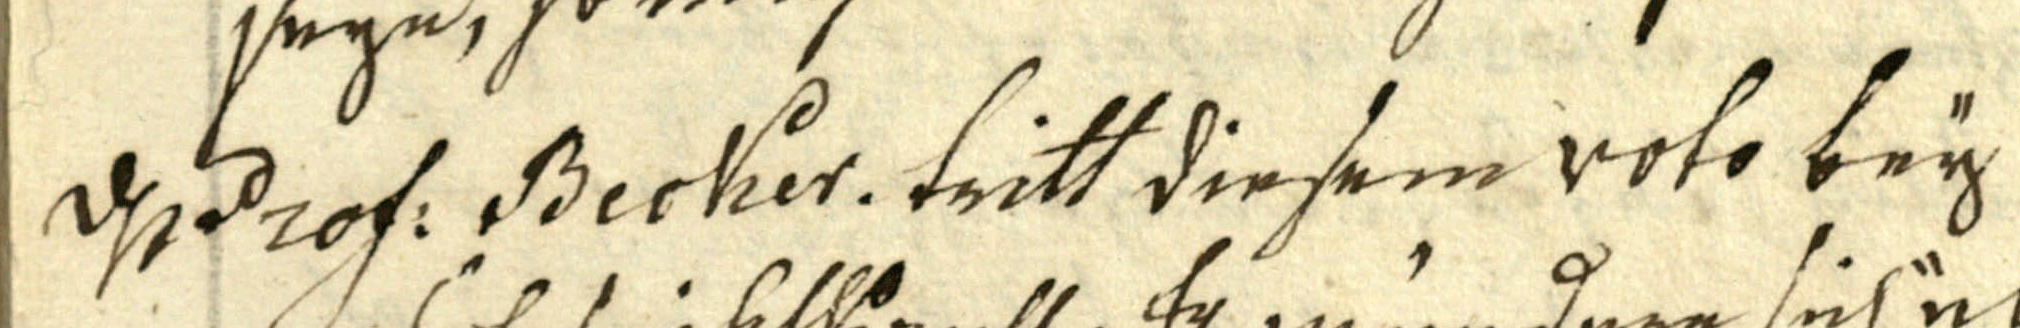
dh Prof. Becker. tritt diesem voto beÿ.
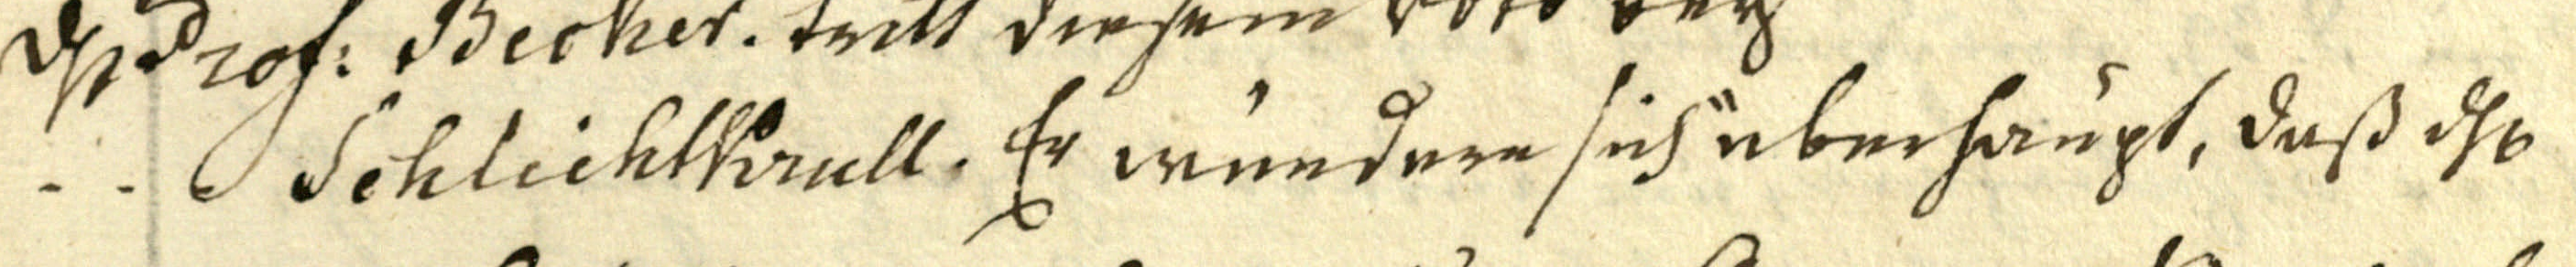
Schlichtkrull. Er wundere sich überhaupt, daß dh
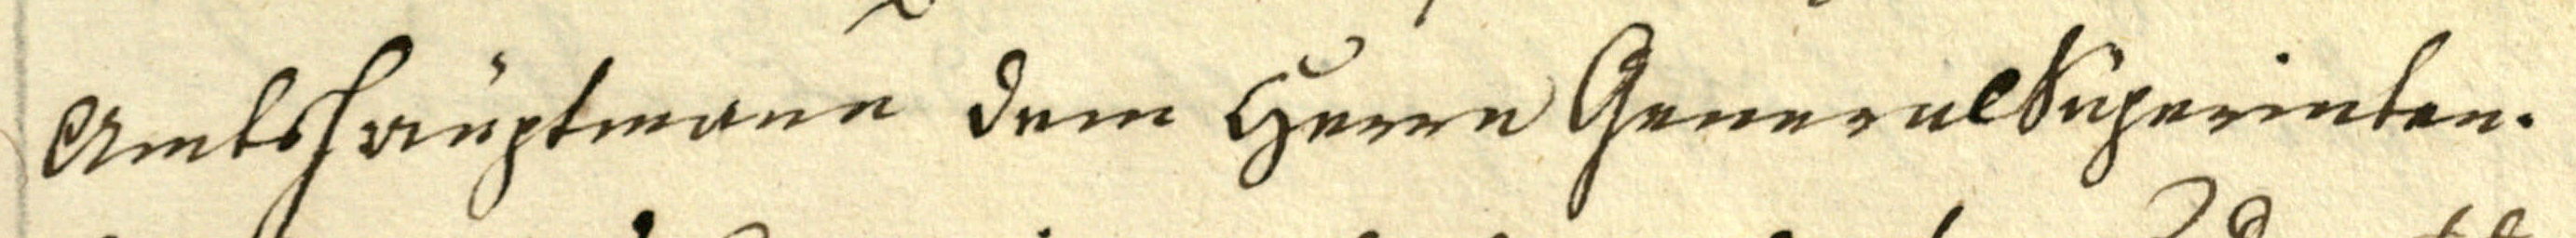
Amtshauptmann dem Herrn GeneralSuperinten¬
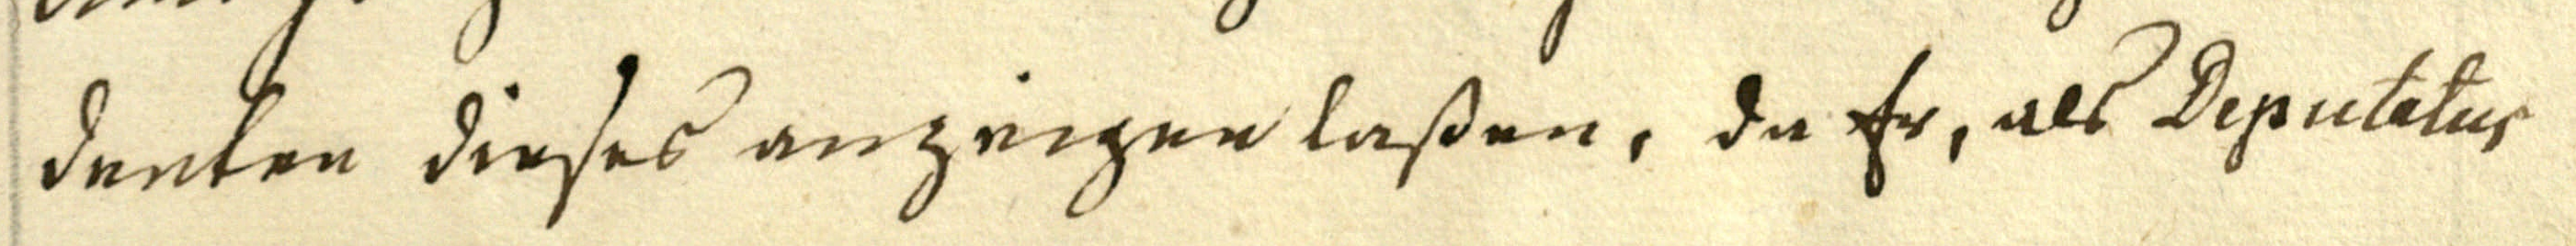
denten dieses anzeigen laßen, da Er, als Deputatus
